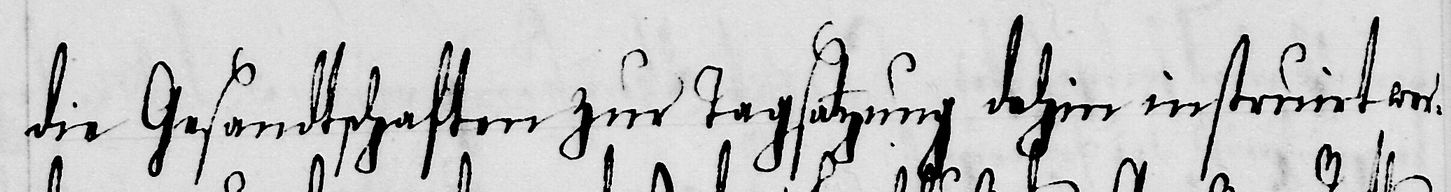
die Gesandtschaften zur Tagsatzung dahin instruirt we¬
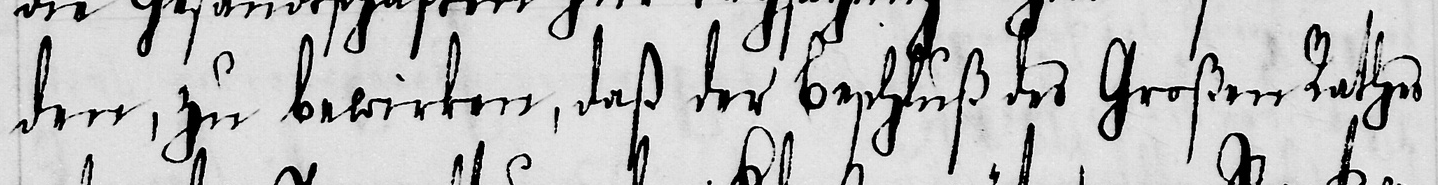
rden, zu bewirken, daß der Beschluß des Großen Rathes
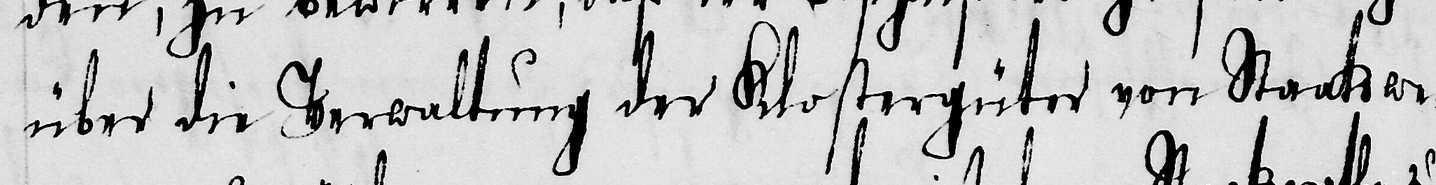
über die Verwaltung der Klostergüter von Staatswe¬
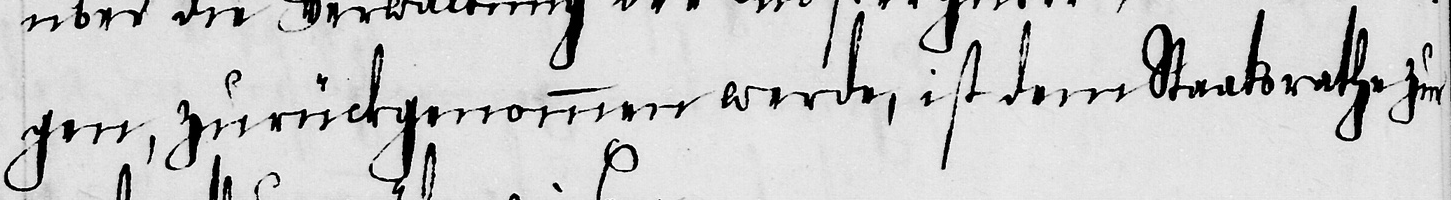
gen, zurückgenommen werde, ist dem Staatsrathe zur
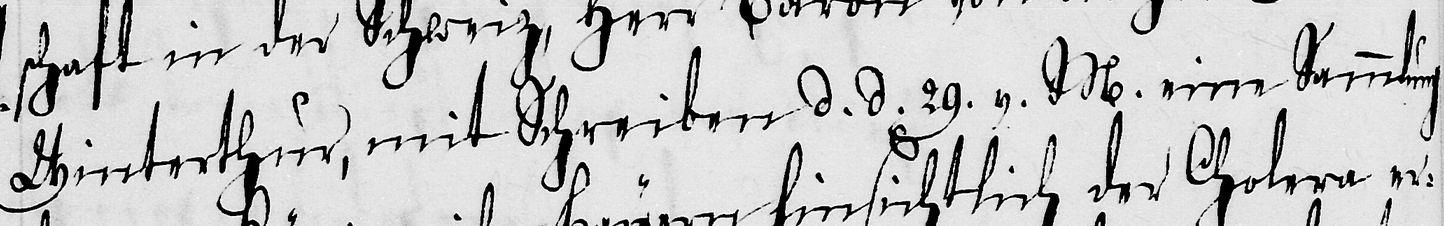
Winterthur, mit Schreiben d. d. 29. v. M. eine Sammlung
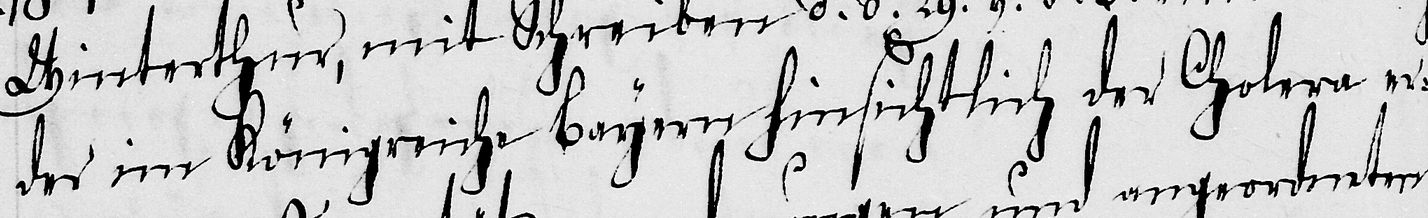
der im Königreiche Bayern hinsichtlich der Cholera er¬
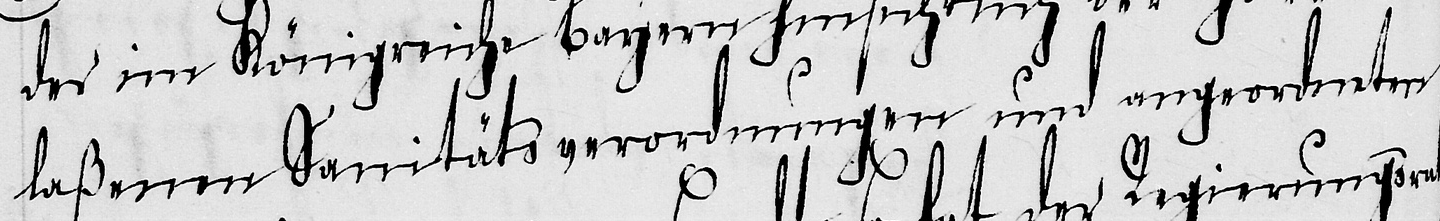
laßenen Sanitätsverordnungen und angeordneten
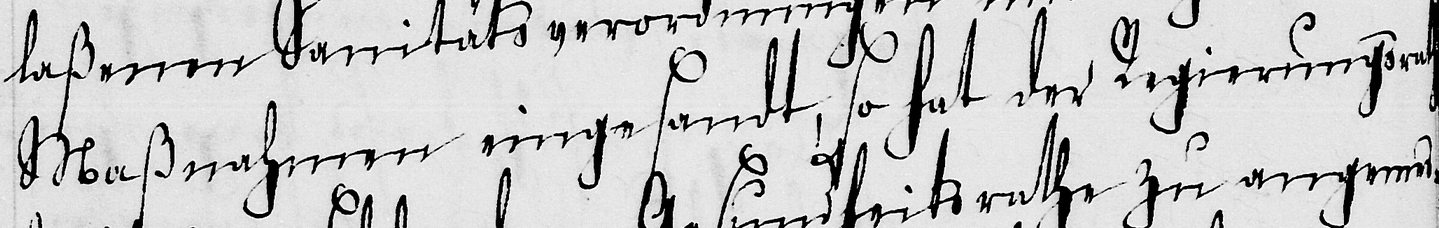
Maßnahmen eingesandt, so hat der Regierungsr¬
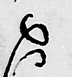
28.
